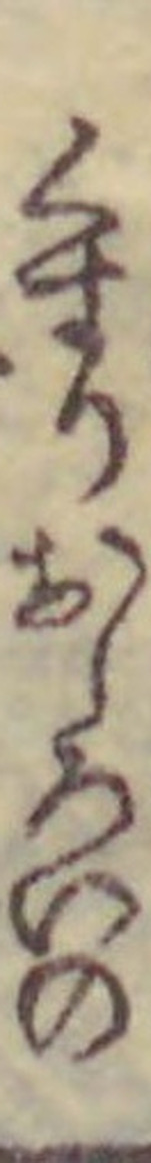くすりおしろいの
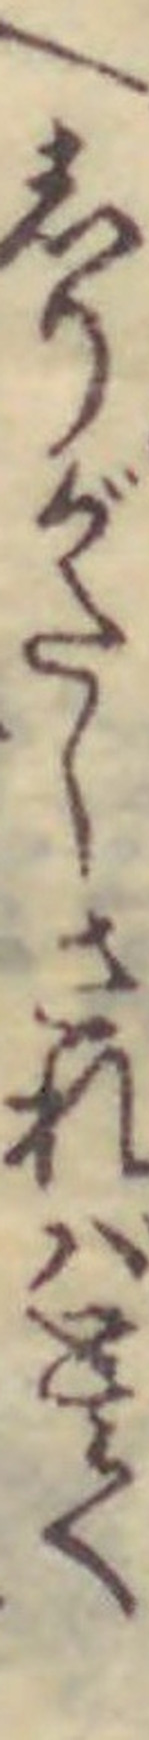しりがたしさればとて
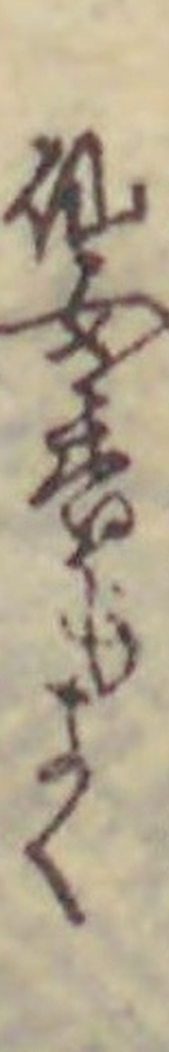仙女香もよく
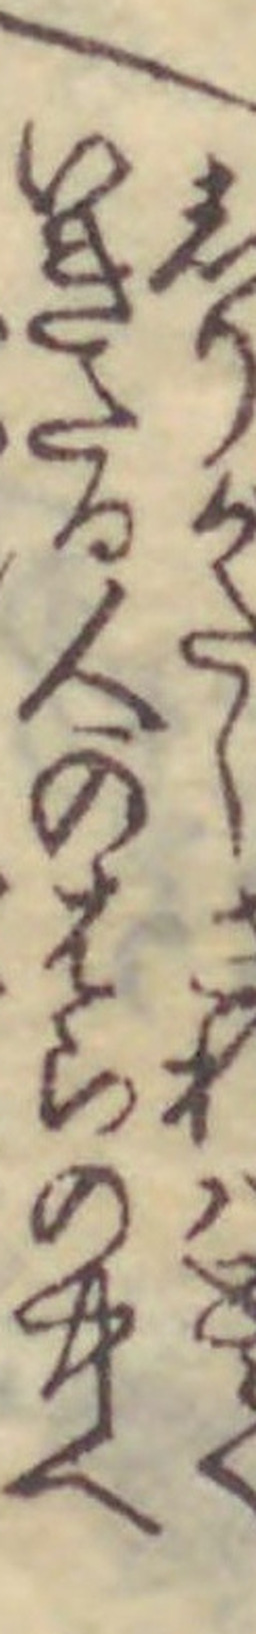いきたる人のはらの中へ
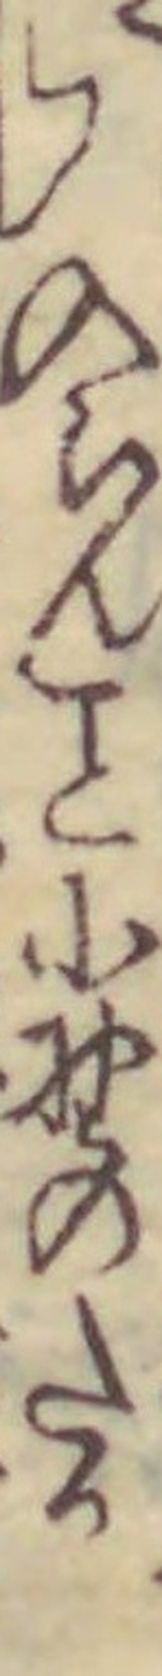入らんこと小野のたか
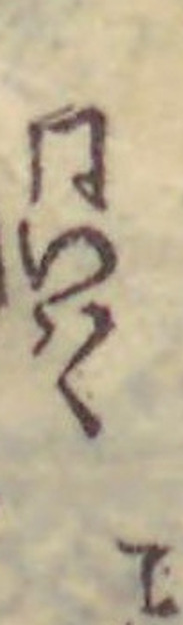同いはく
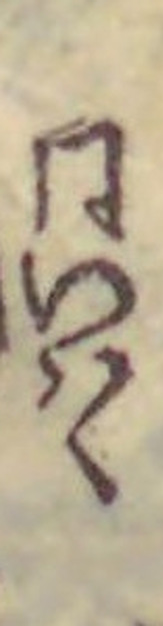同いはく
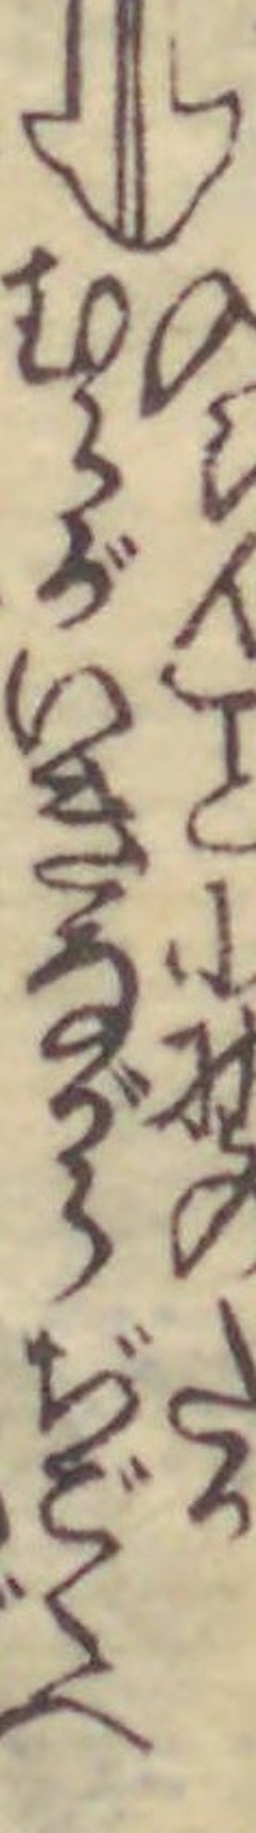むらがいきながらぢごくへ
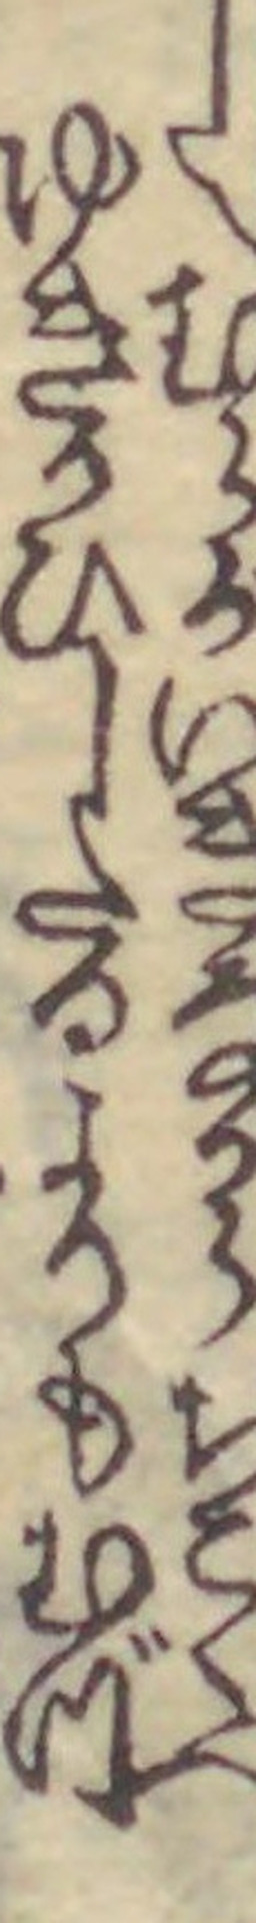ゆきかひしたるよりもむづ
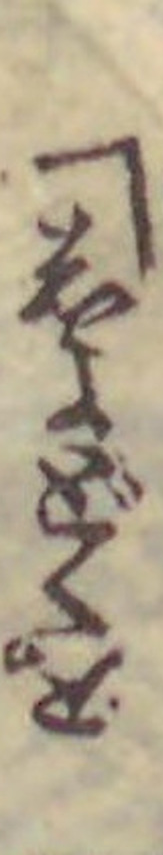〽しよどくを
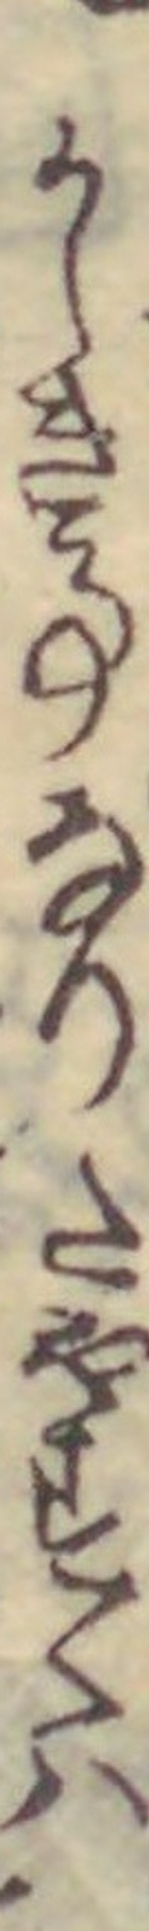かしき事なりたやすくは
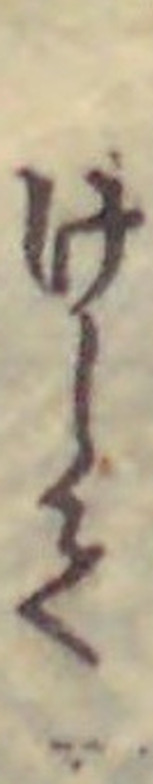けして
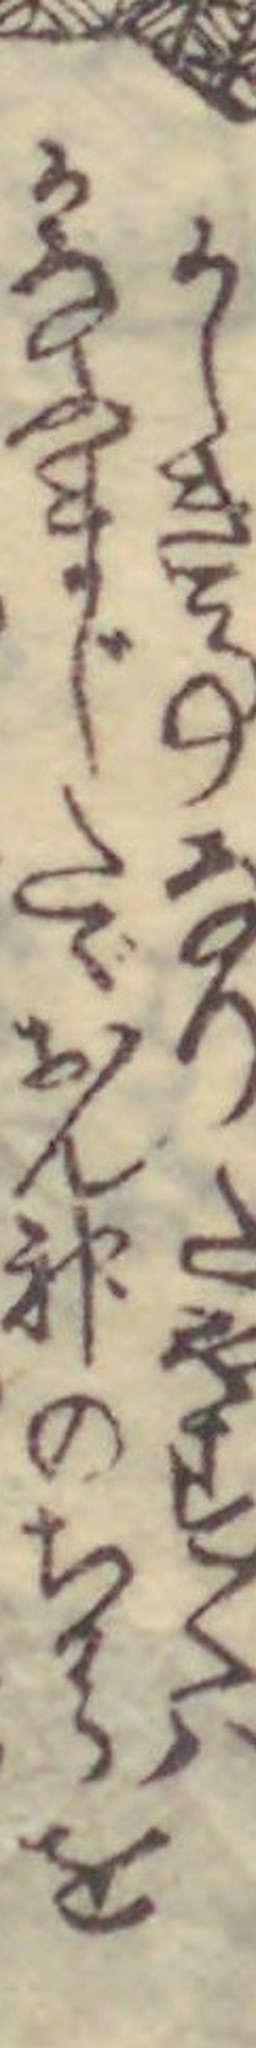かなふまじたゞおん神のちからを
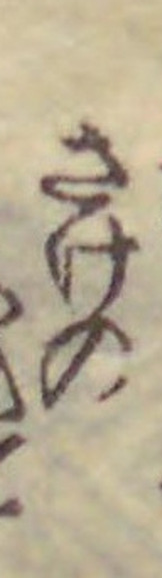さけの
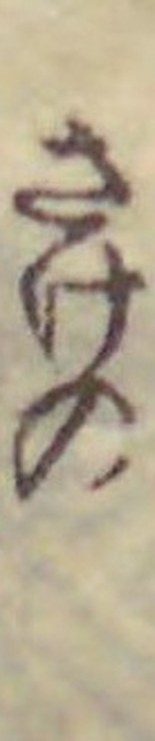さけの
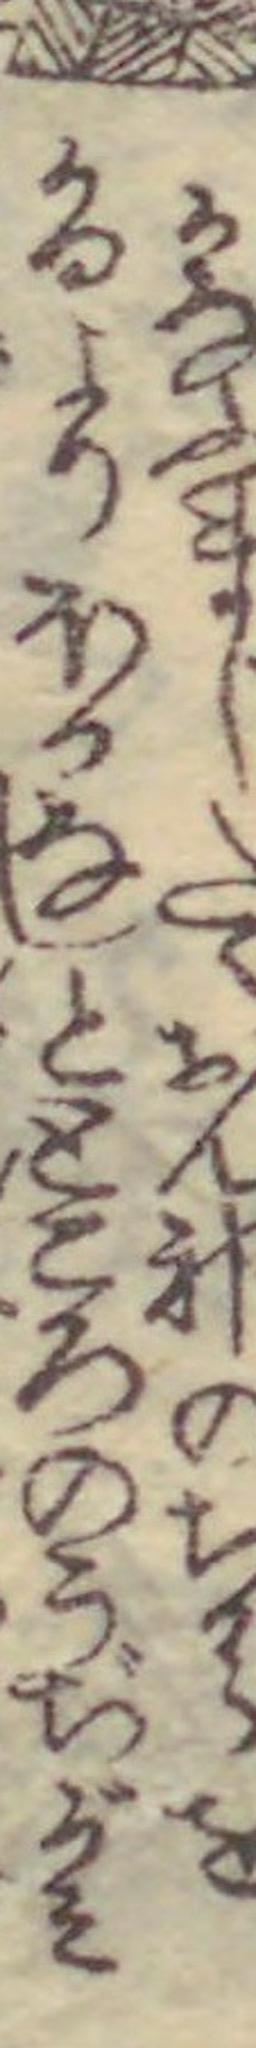かるよりほかなしとところのうぢがみ
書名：腹内窺機関 2巻
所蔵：国立国会図書館 National Diet Library, JAPAN
